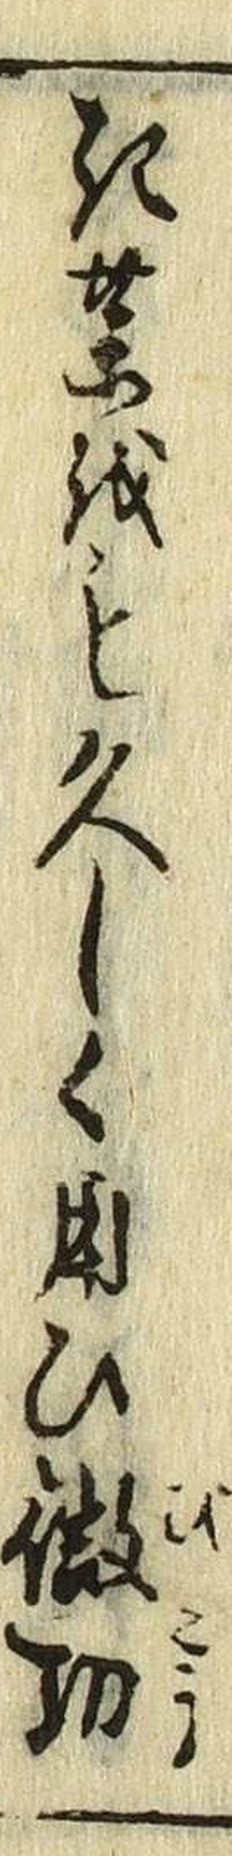き薬をも久しく用ひ微功
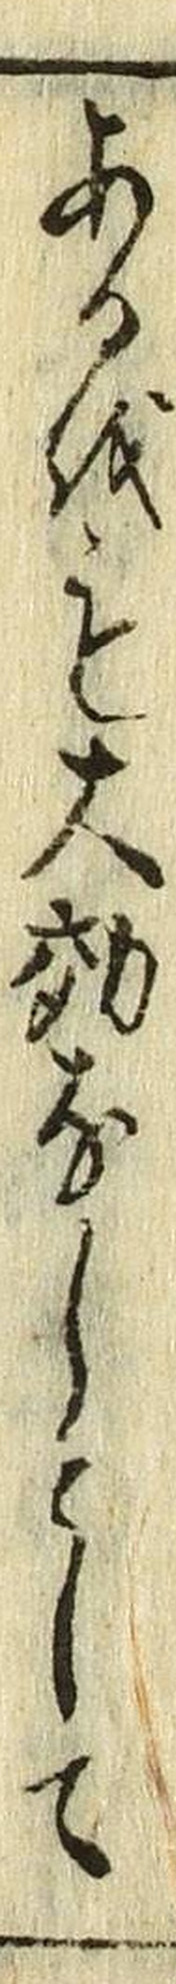あるをも大効なしとして
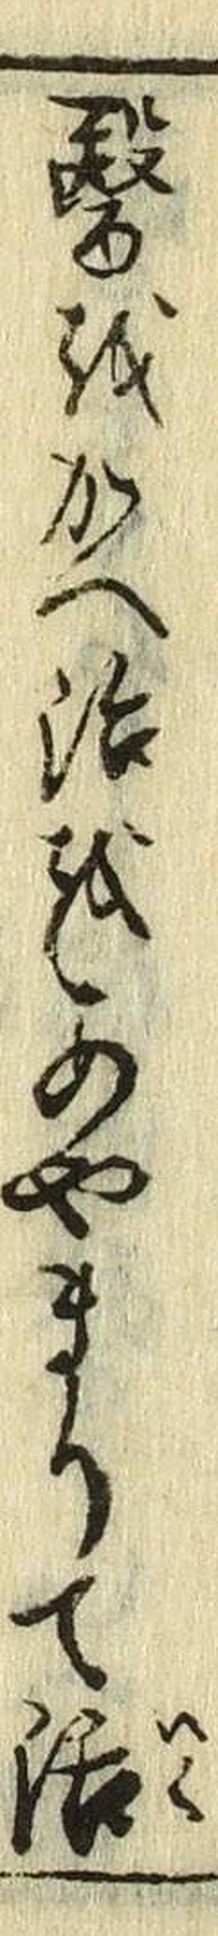医をかへ治をあやまりて活
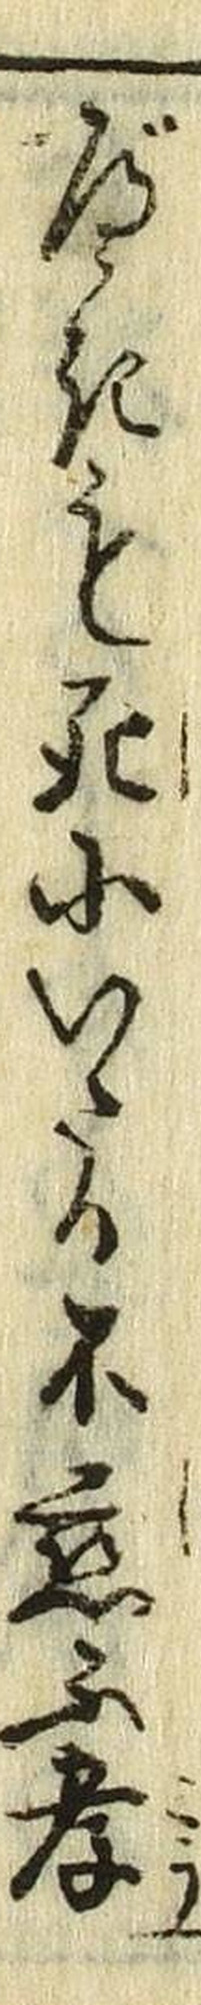べきも死にいたる不慈不孝
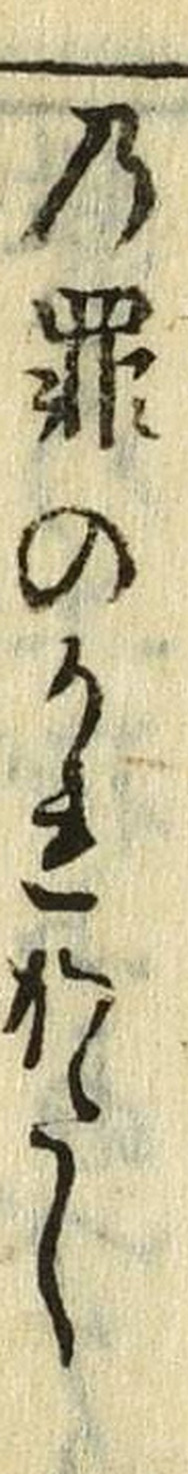の罪のかれかたし
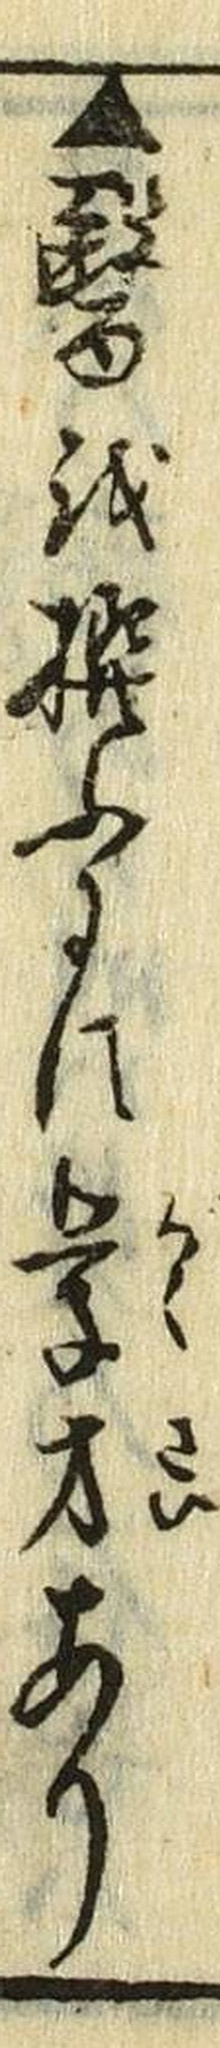▲医を撰ふには学才あり
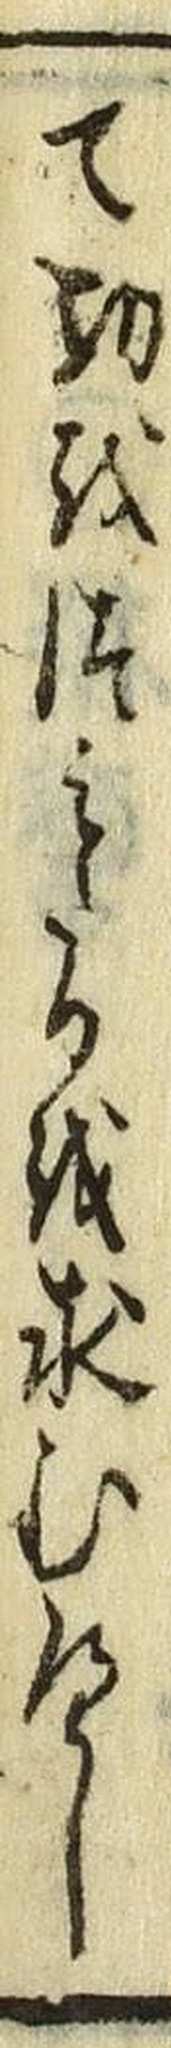て功をつみたるを求むへし
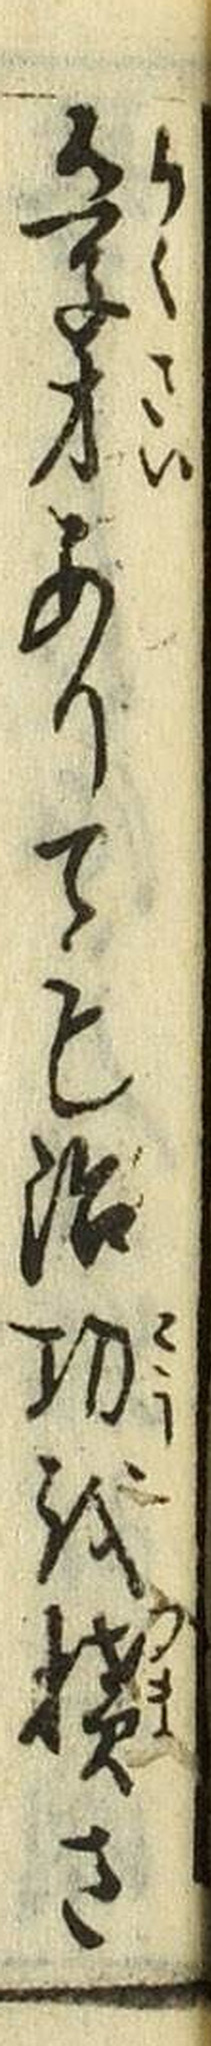学才ありても治功を積さ
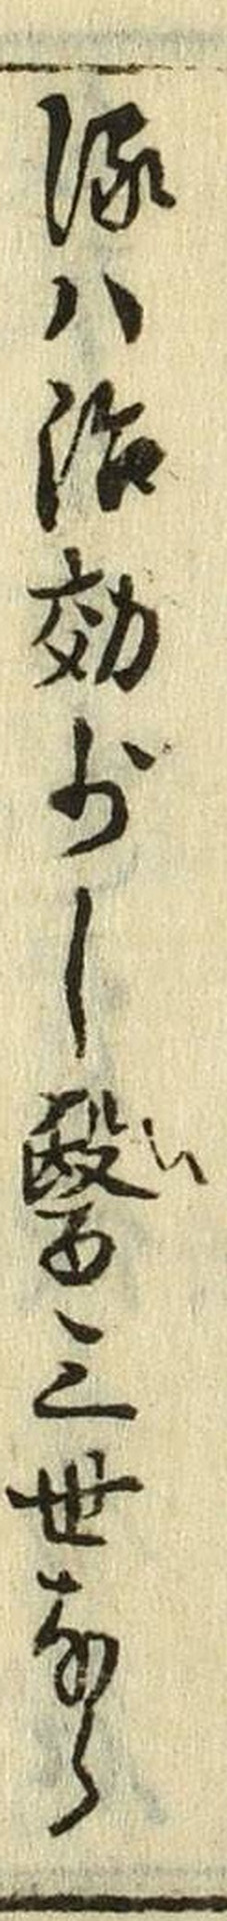るは治効少し医三世なら
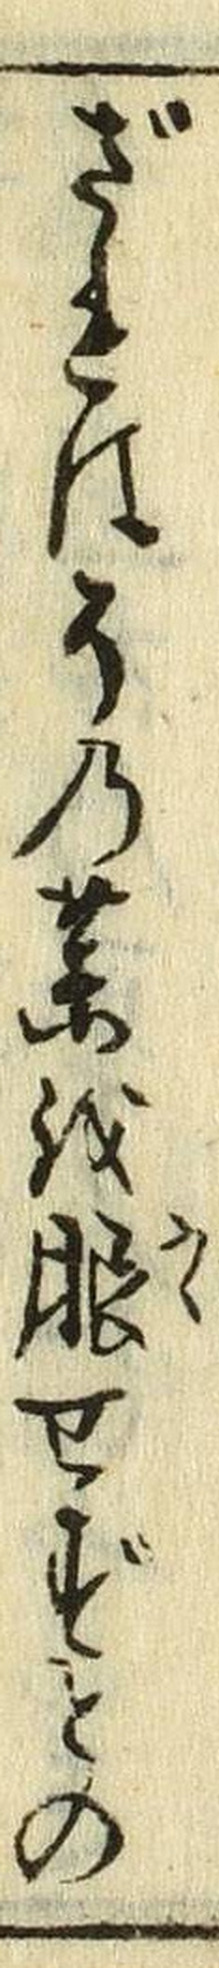ざれはその薬を服せずとの
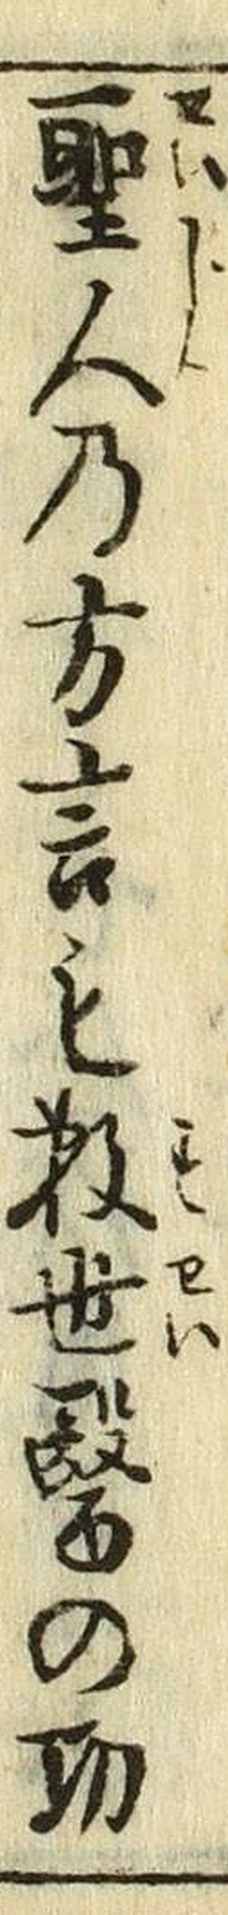聖人の方言も数世医の功
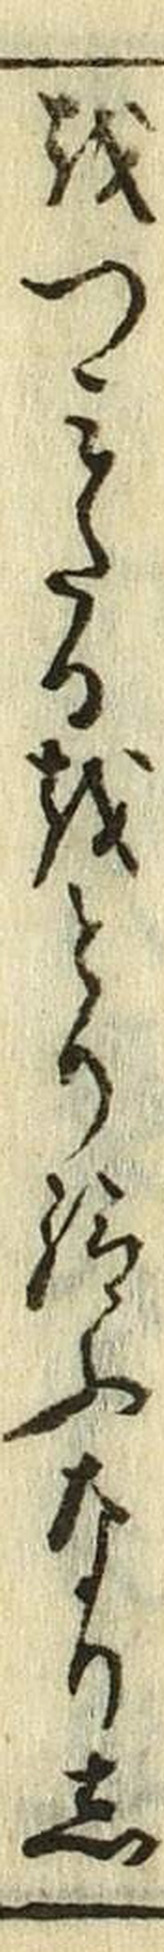をつみたるをとり給ふなりし
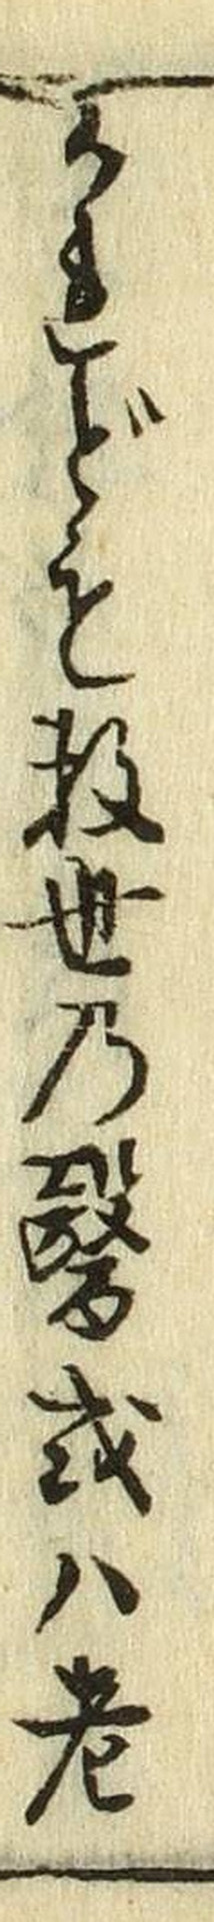かれども数世の医或は老
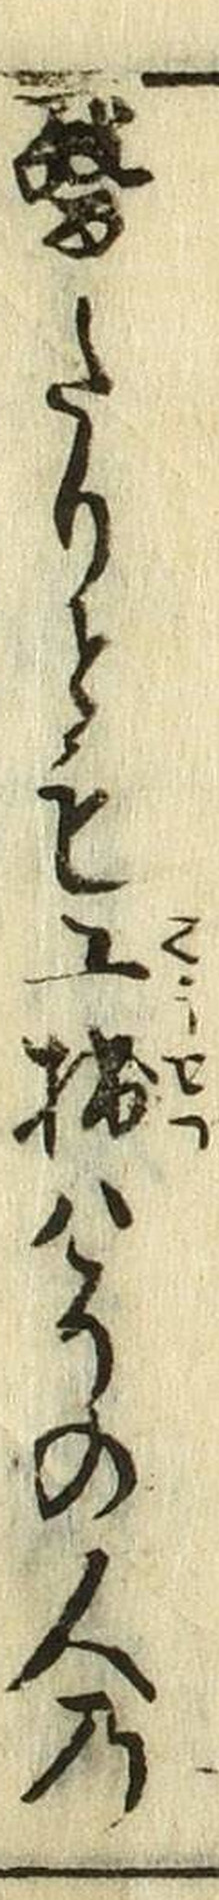医たりとも工拙はその人の
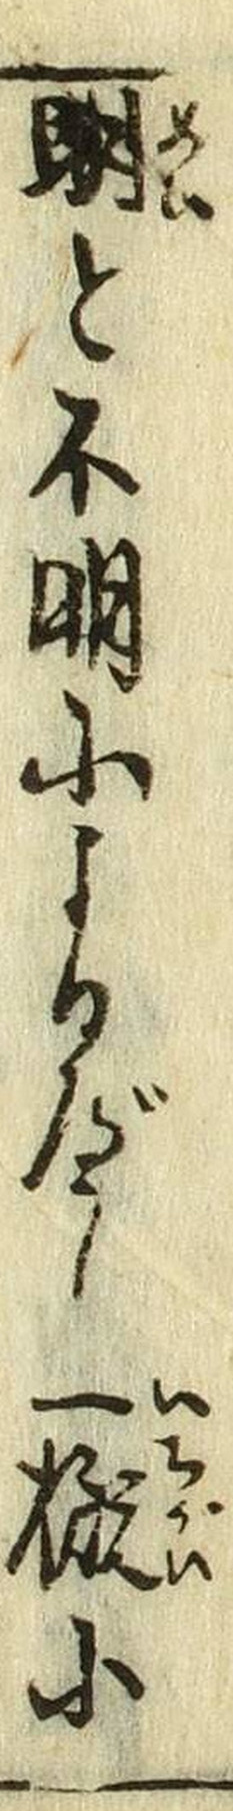明と不明によるべし一概に
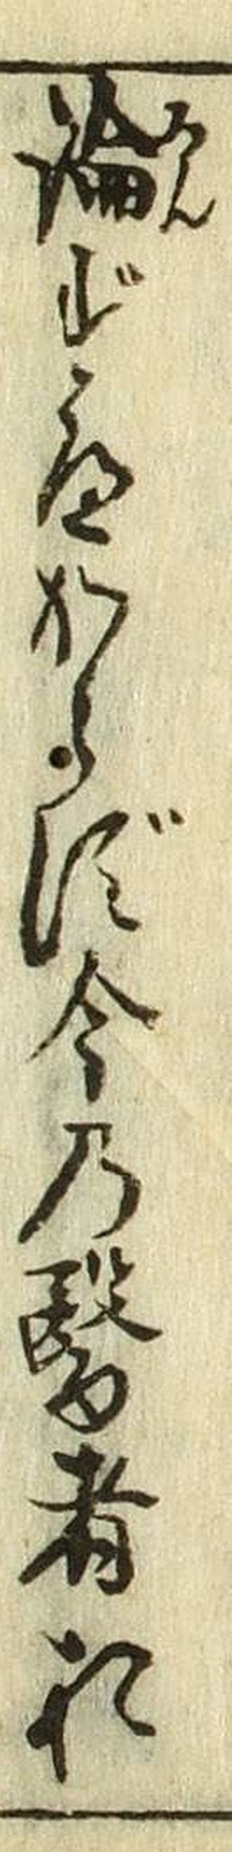論ずへからず今の医者お
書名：居家養生記
